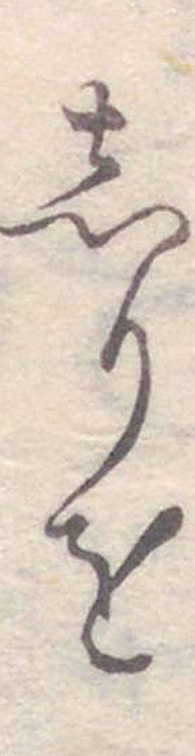しりを
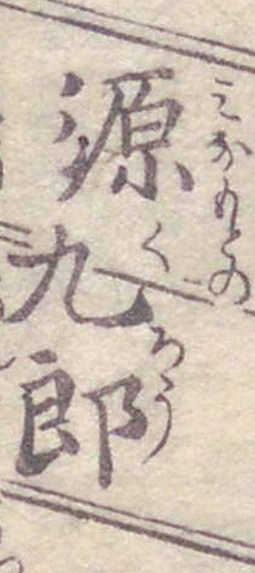源九郎
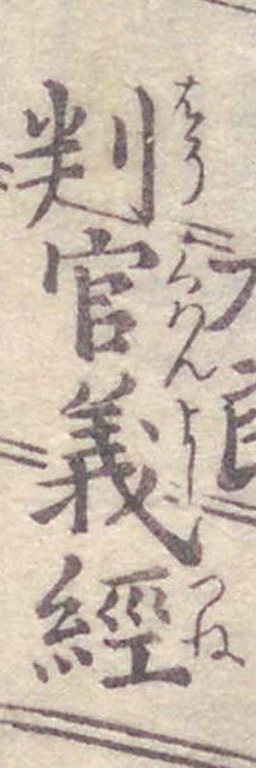判官義経
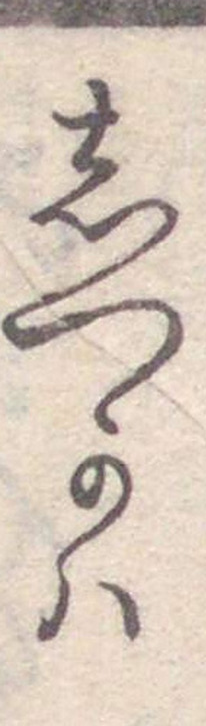しつかは
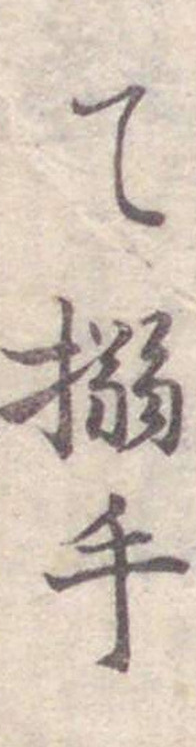て搦手
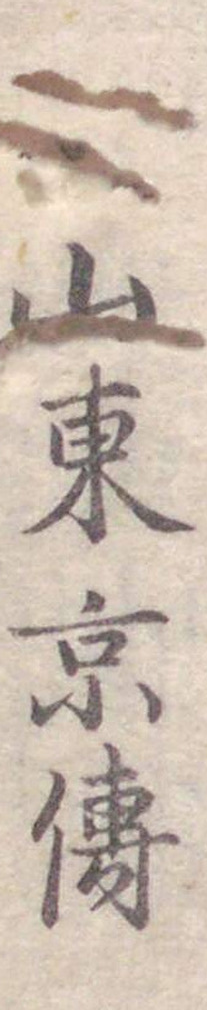山東京伝

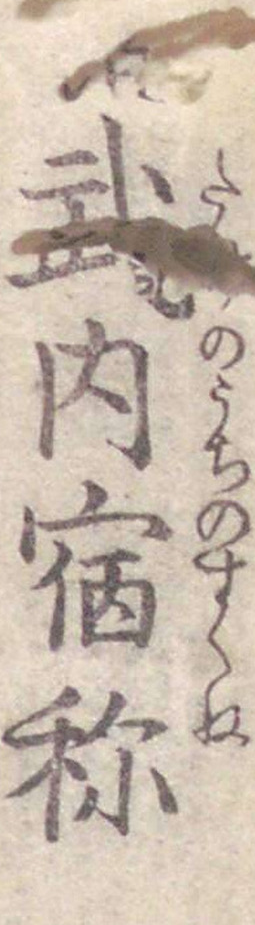武内宿禰
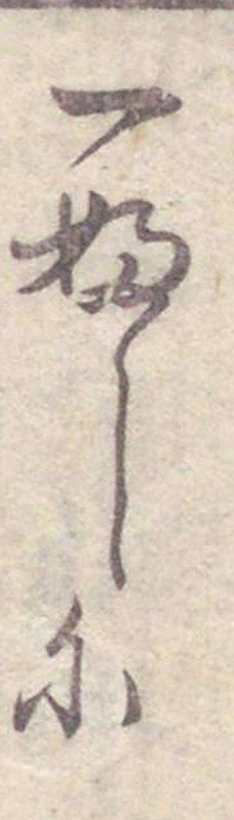一ふしに
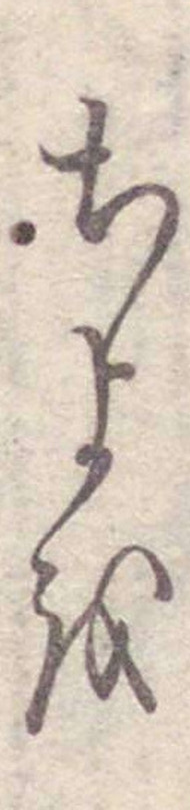ちよを
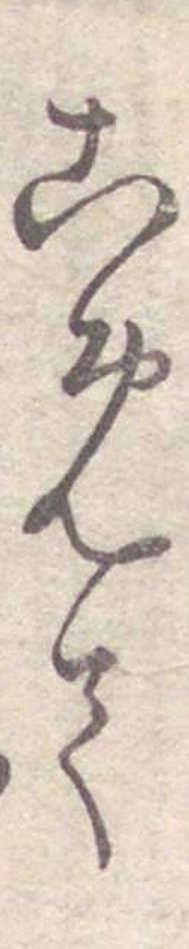こめて
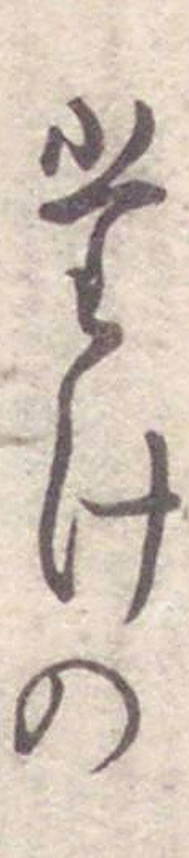たけの
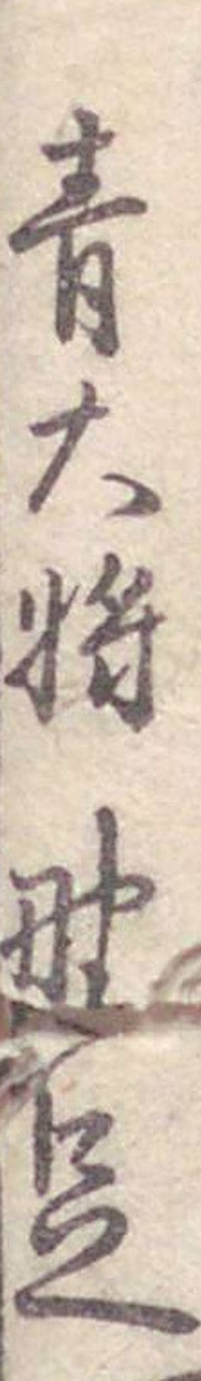青大将野足

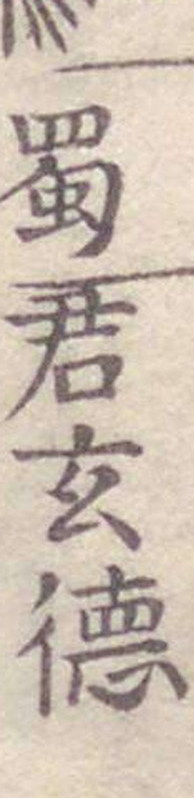蜀君玄徳
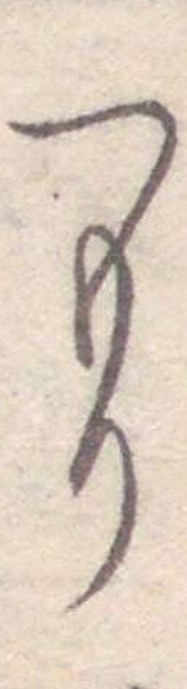つもり

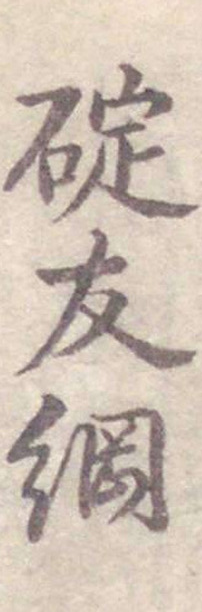碇共綱
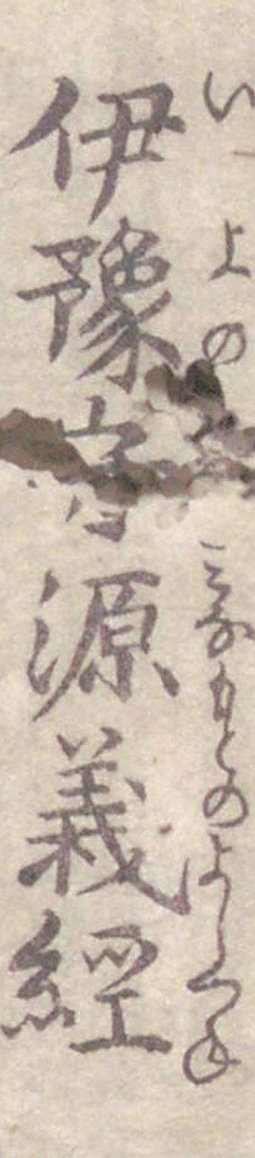伊予守源義経
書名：繪本八十宇治川
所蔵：九州大学中央図書館 国文学研究資料館
